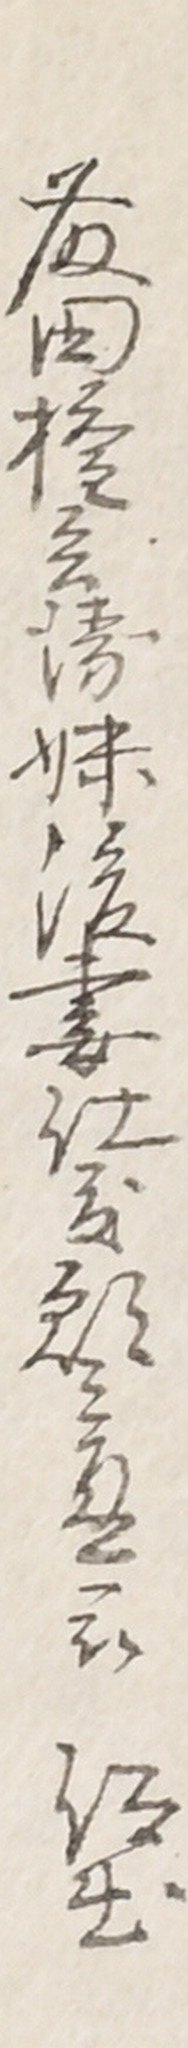藤田権兵衛妹後妻仕度願之通被仰出
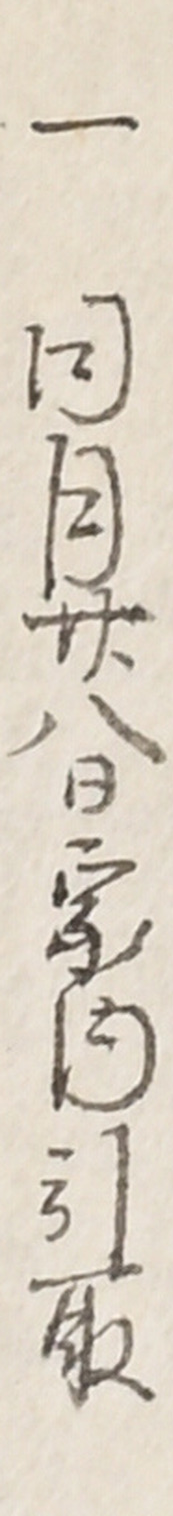一同月廿八日家内引取
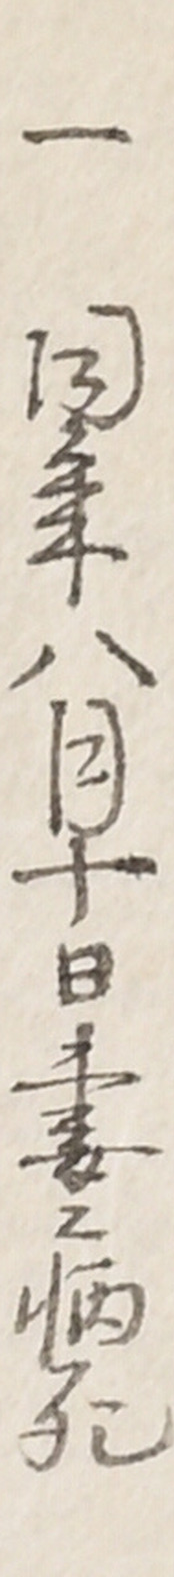一同年八月十日妻病死
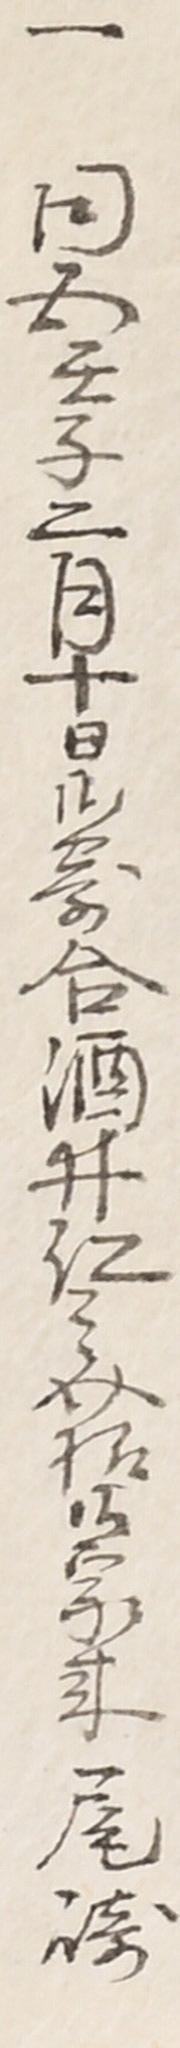一同五壬子二月十日御寄合酒井仁之介様御家来尾崎
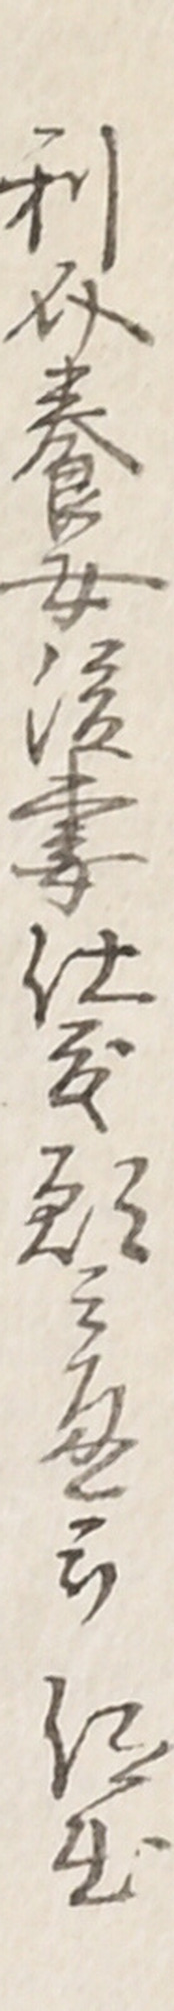利介養女後妻仕度願之通被仰出
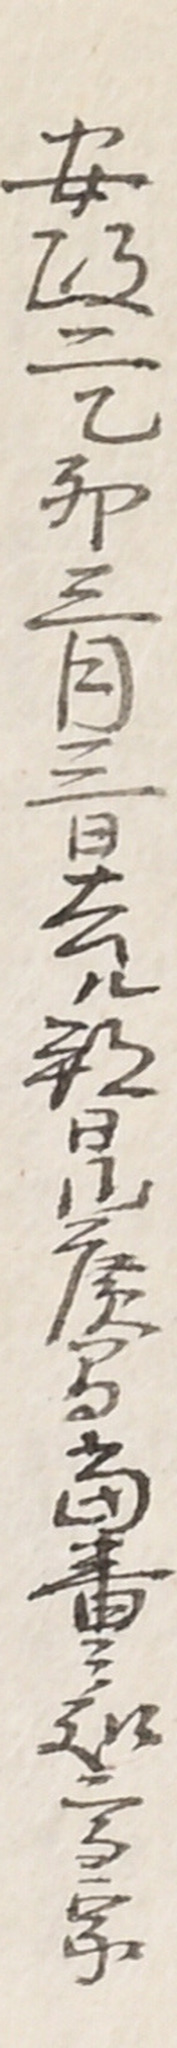一安政二乙卯三月三日去ル朔日御広間当番之処高家
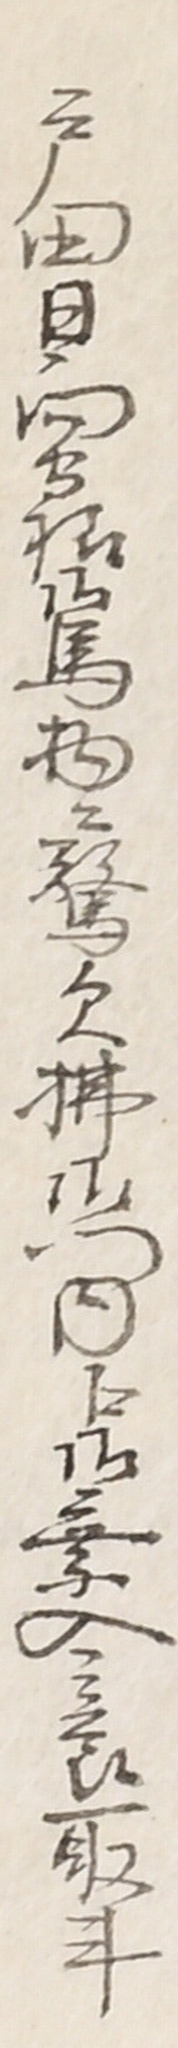戸田日向守様御馬物ニ驚欠払御門内江御乗入之節取計
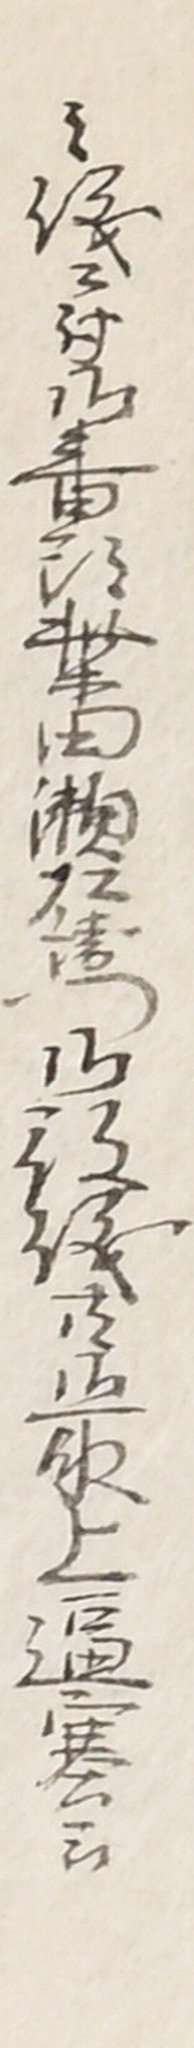之儀ニ付御番頭柴田瀬左衛門御役儀共御取上逼塞被
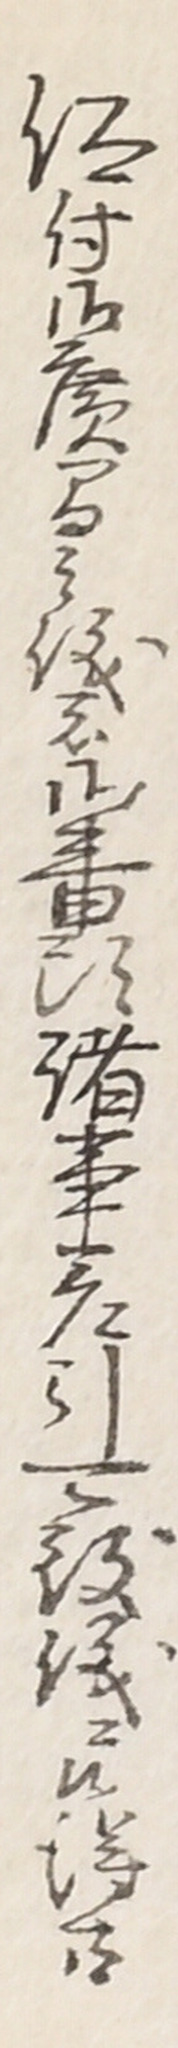仰付御広間之儀は御番頭諸事差引可致儀ニ候得共
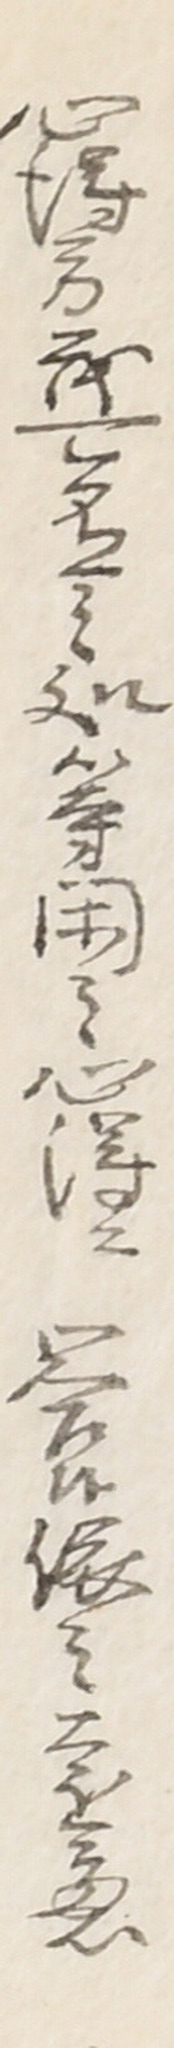心得方も可有之処等閑之心得ニ思召候依之遠慮
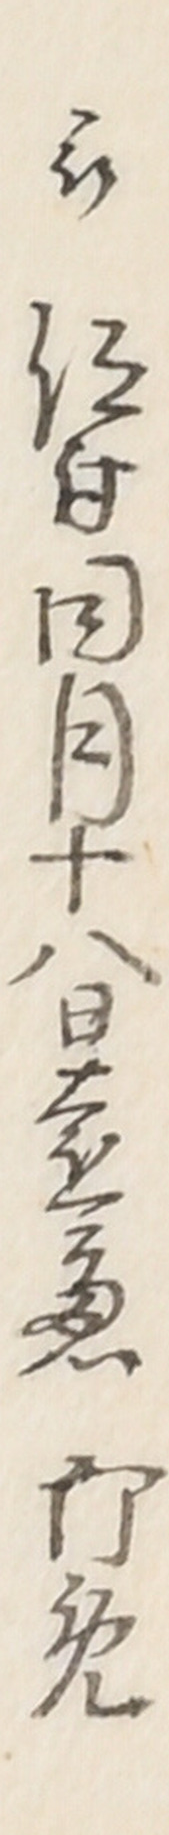被仰付同月十八日遠慮御免
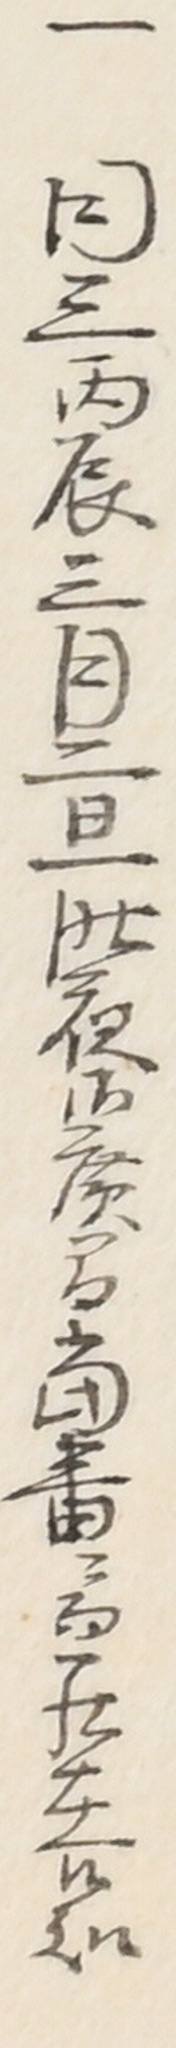一同三丙辰三月二日一昨夜御広間当番ニ而罷在候処
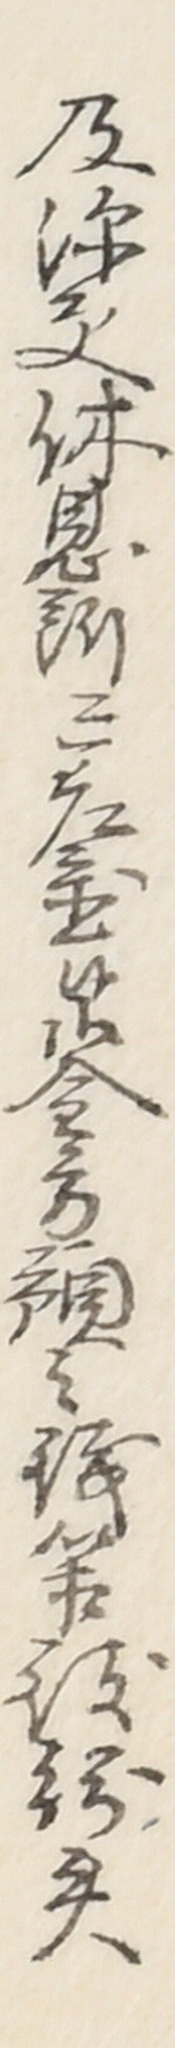及深更休息所ニ差置候御金方預之銭箱致紛失
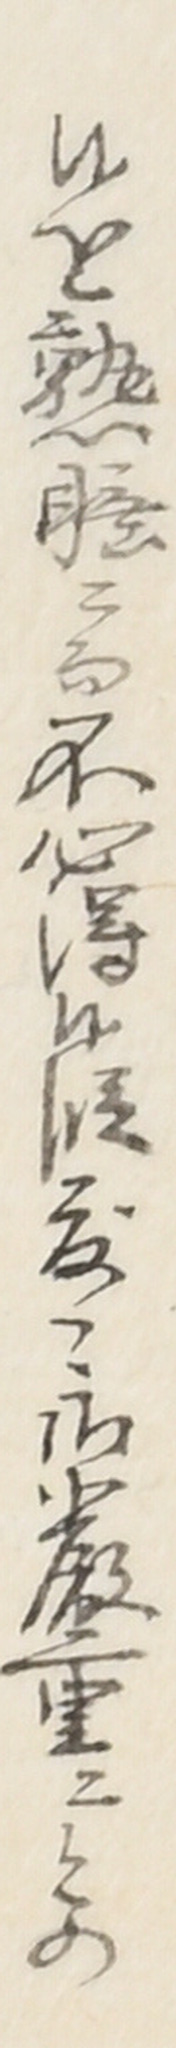候を熟睡ニ而不心得候段度々御厳重ニとの
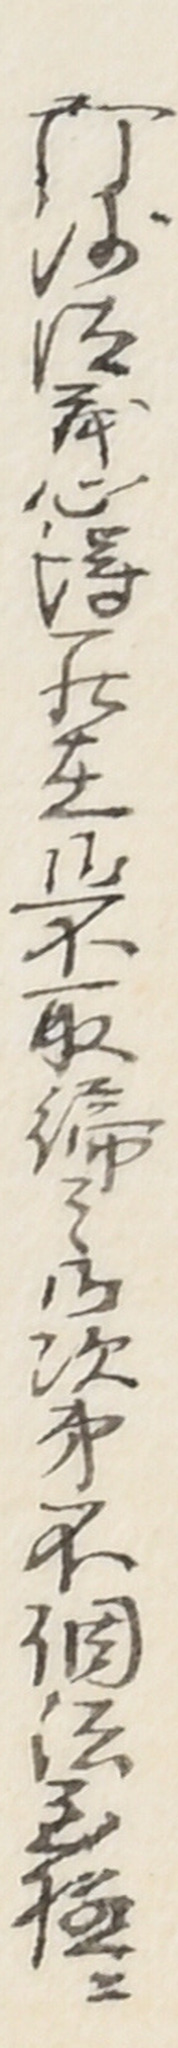御沙汰も心得罷在御不取締之御次第不調法至極ニ
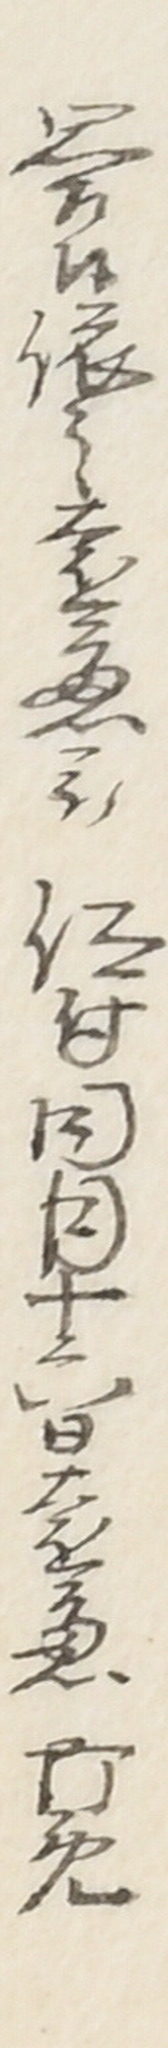思召候依之遠慮被仰付同月十六日遠慮御免
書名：給人諸士勤仕録（七）
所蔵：伊那市立高遠町図書館・合同会社AMANE
